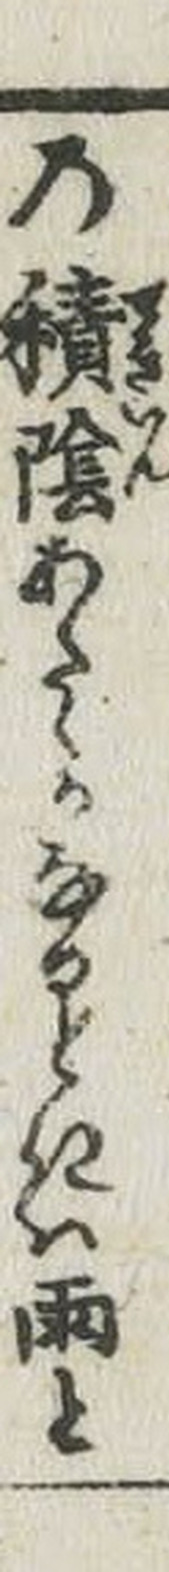の積陰あたゝかなるときは雨と
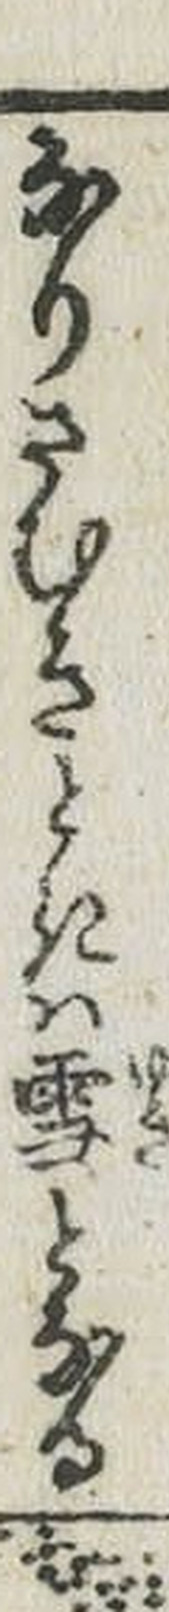なりさむきときは雪となる
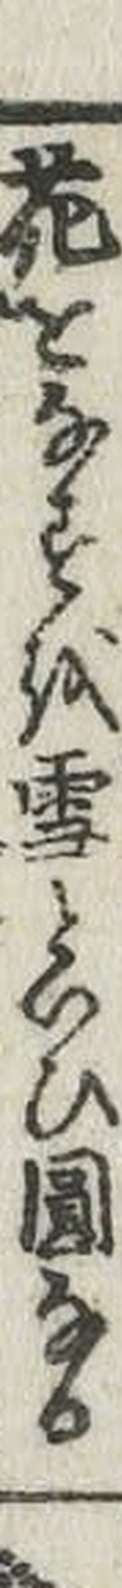花をなすを雪といひ円なる
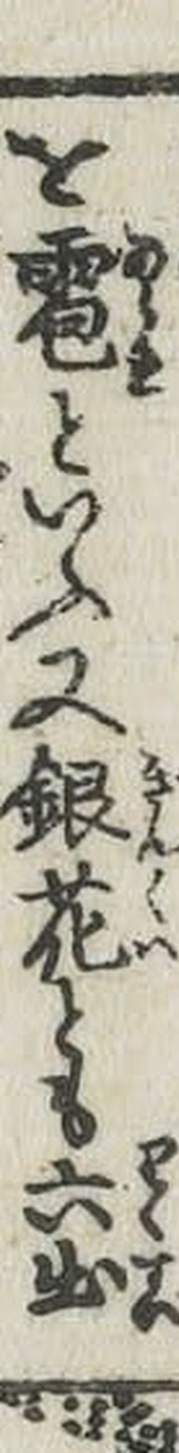を雹といふ又銀花とも六出
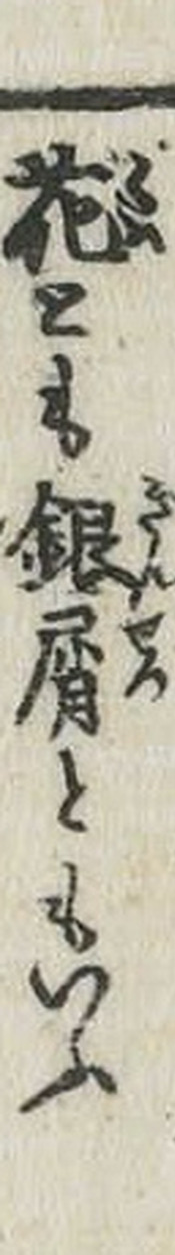花とも銀屑ともいふ
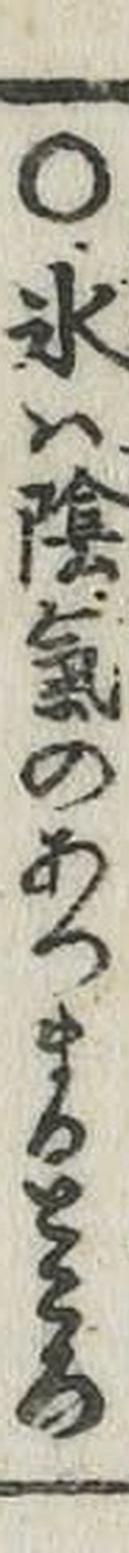○氷は陰気のあつまるところ
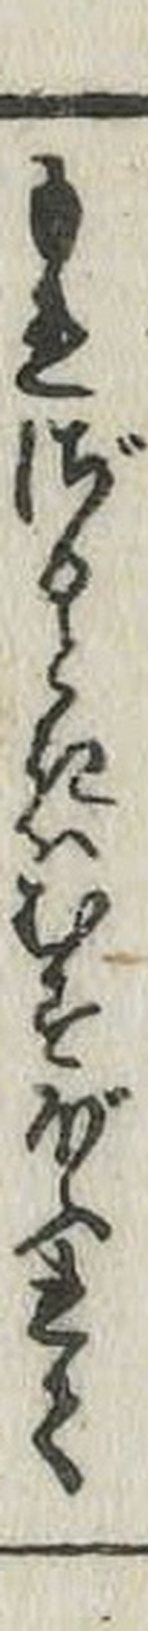もれざるときはむすぼふれて
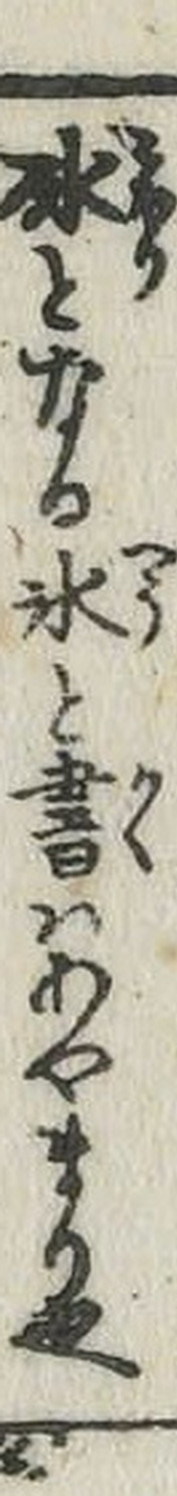冰となる氷と書はあやまり也
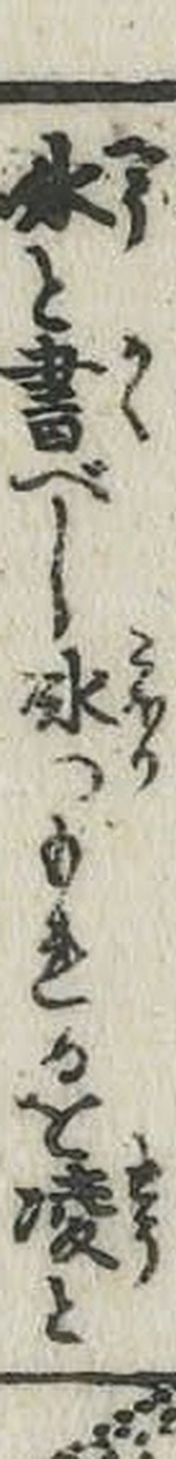冰と書べし冰つもれるを凌と
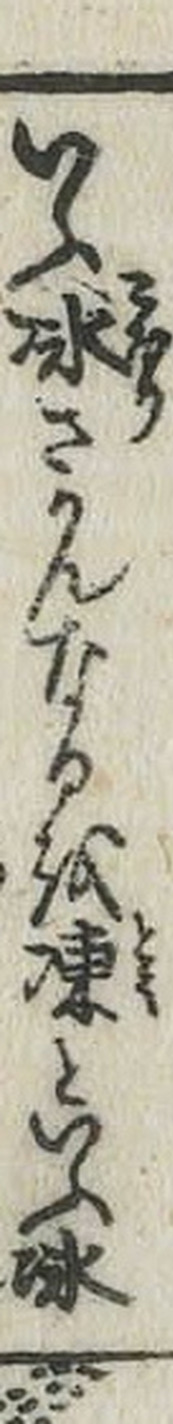いふ冰さかんなるを凍といふ冰
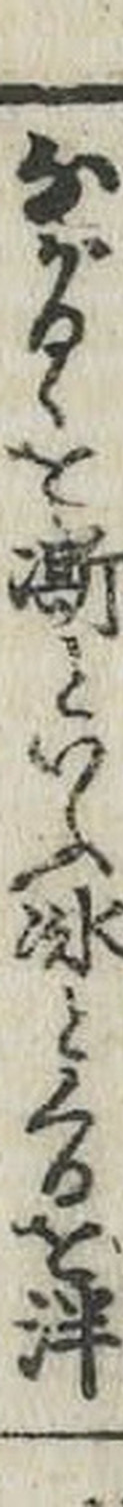ながるゝを凘といふ冰とくるを泮
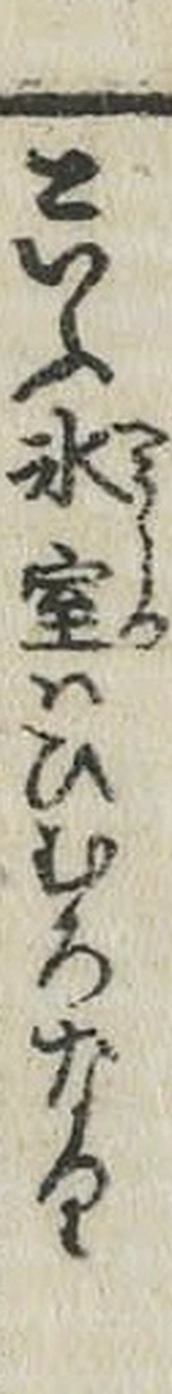といふ氷室はひむろなり

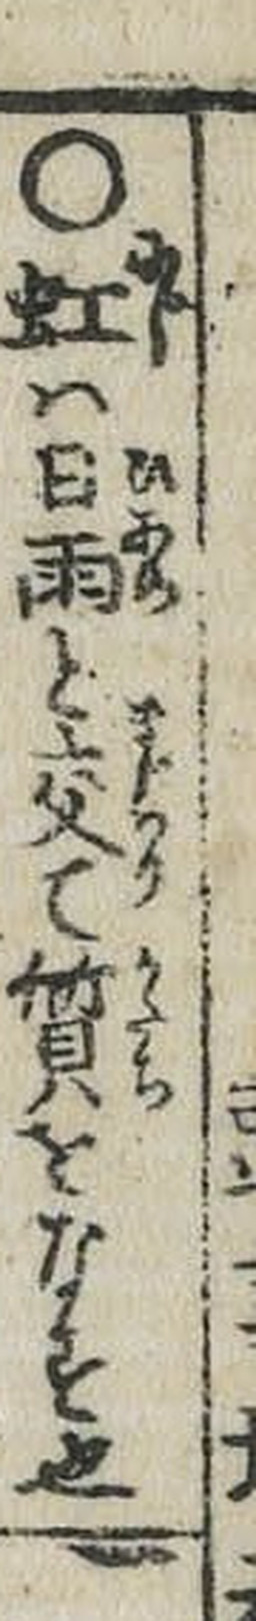○虹は日雨と交て質をなす也
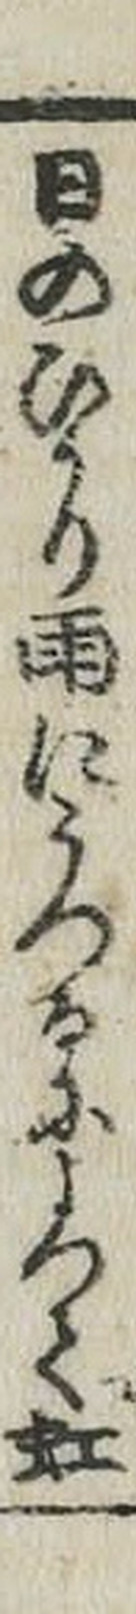日のひかり雨にうつるによつて虹
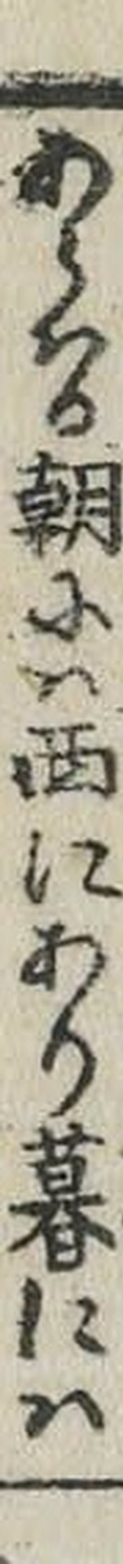あらはる朝には西にあり暮には
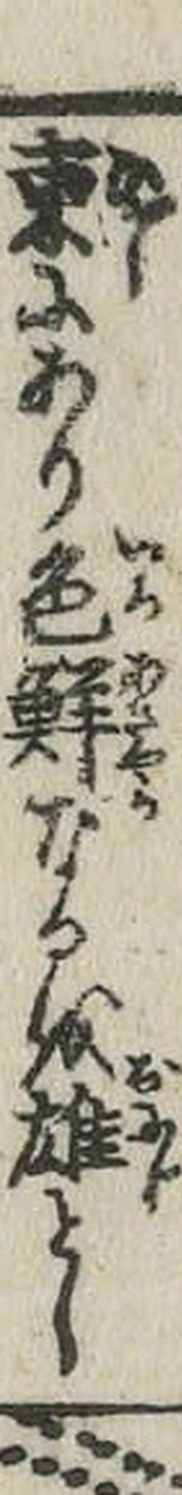東にあり色鮮なるを雄とし
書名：増補頭書訓蒙図彙大成 10巻 2:巻之1-3
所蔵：東京学芸大学教育コンテンツアーカイブ
